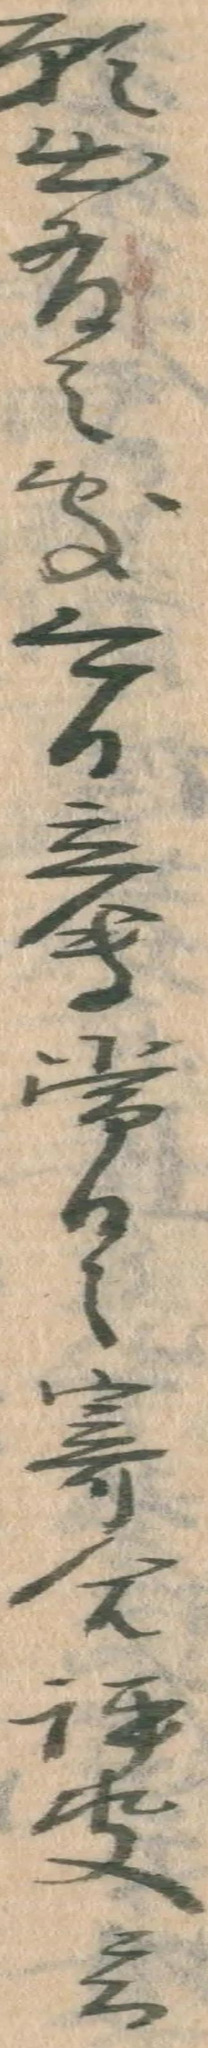願出有之處、今日立會常日之寄合評決ニ而、
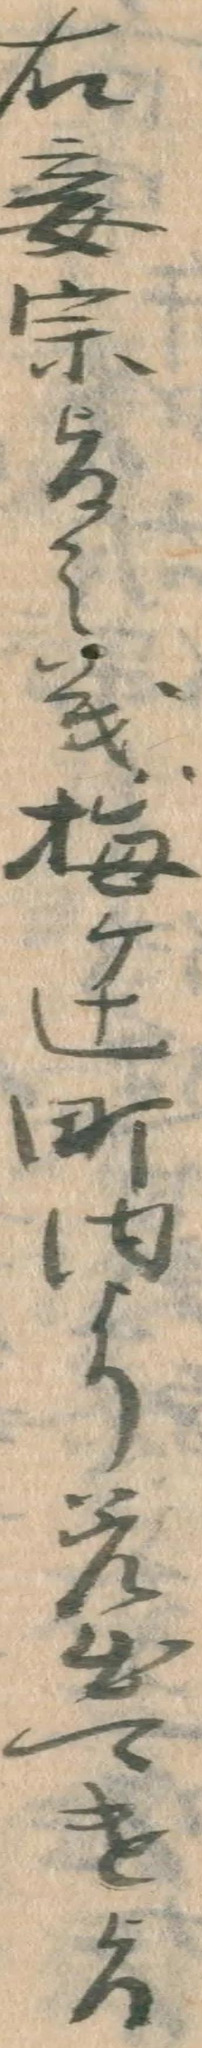右妾宗旨之義、梅ケ辻町内より差出可遣旨
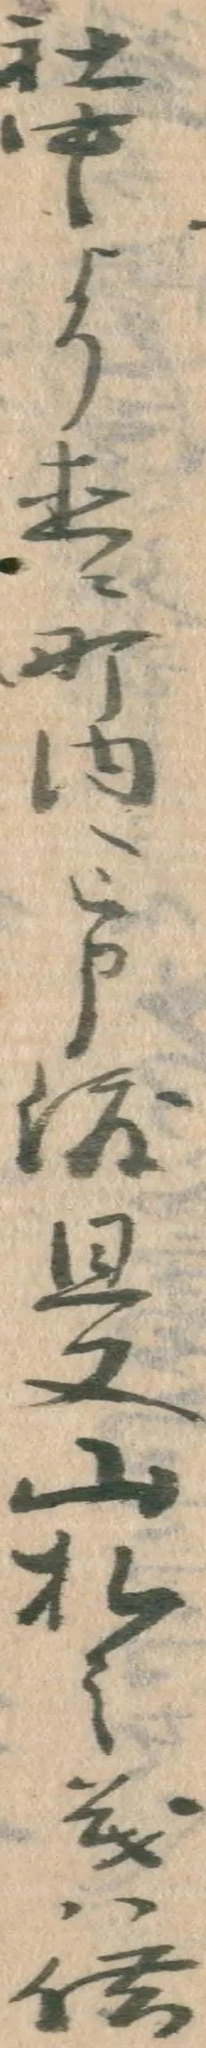社中より直ニ町内へ被申渡、且又山札之義ハ、借
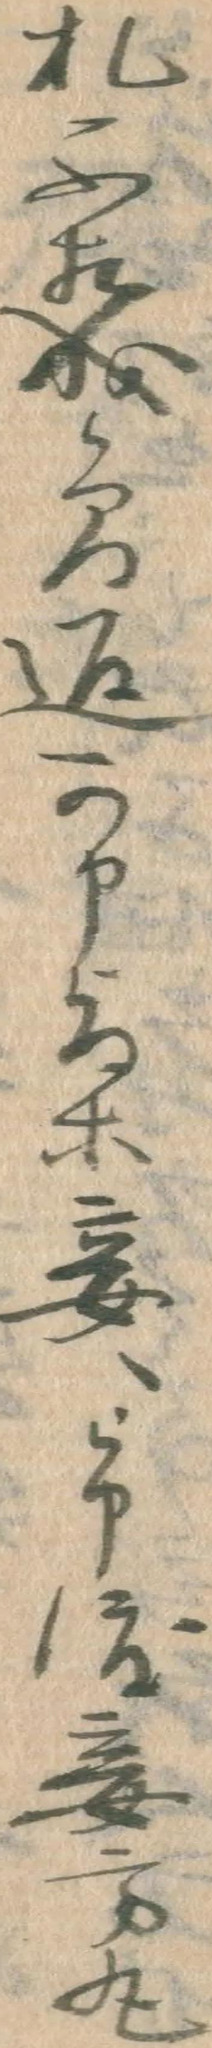札不相成候間、返可申旨等妾へ被申渡、妾方丸
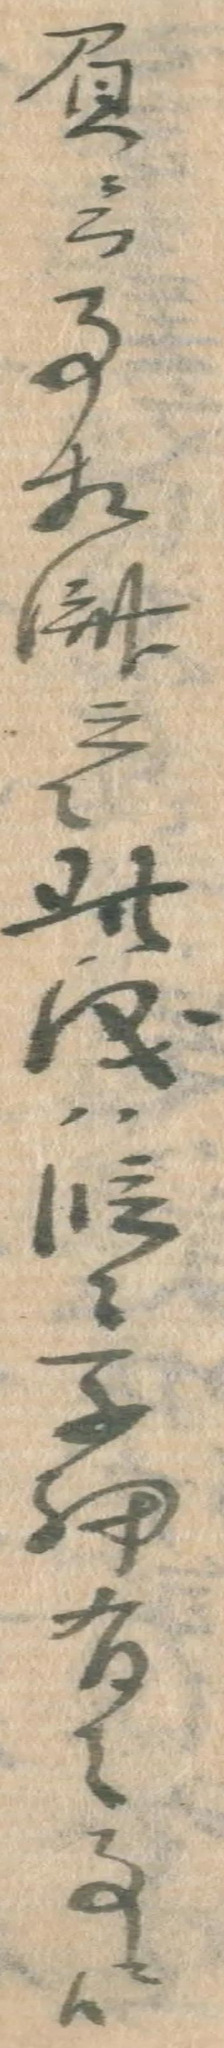負ニ而事相済云々、此儀は段々子細有之事ニ候
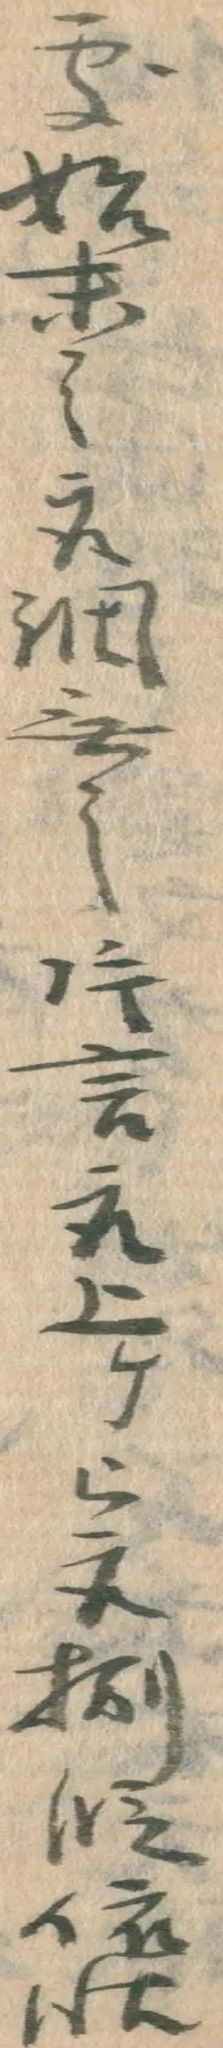處、始末之取調無之、片言取上ケ被取捌段、依怙
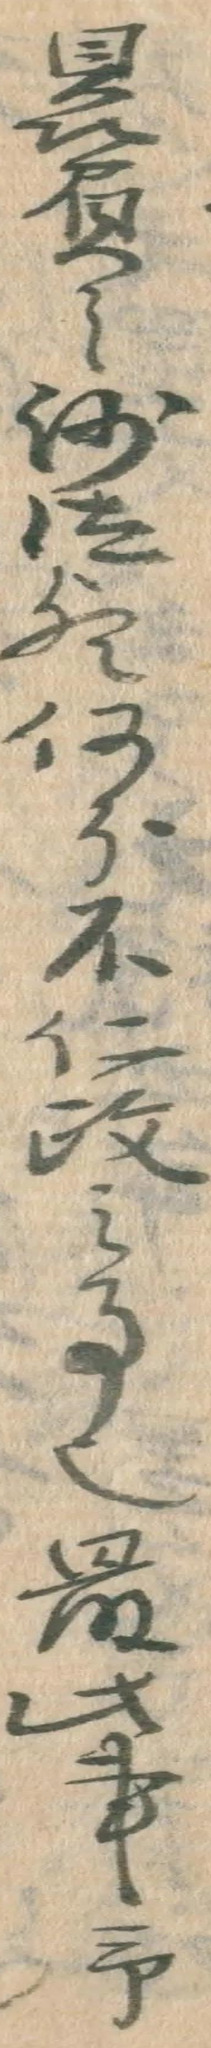贔屓之沙汰歟、何分不仁政之事也、最此事予
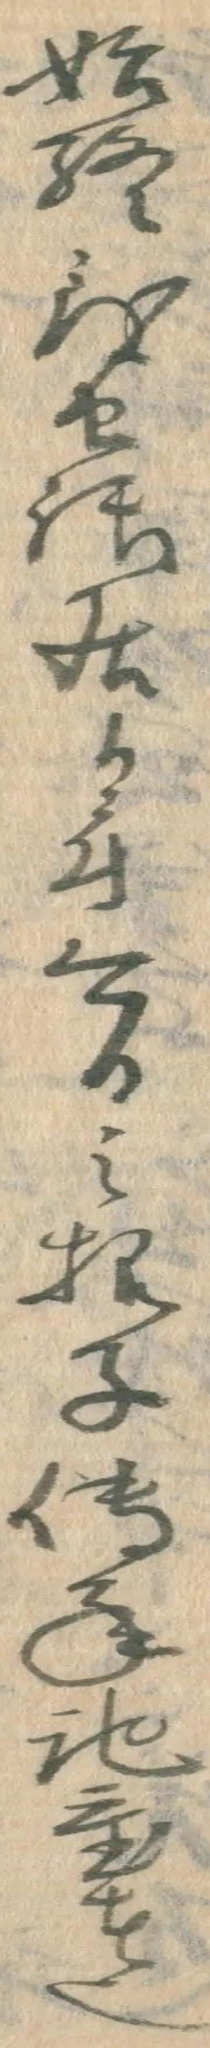始終致由詰居候ニ付、今日之様子傳承記置申也、
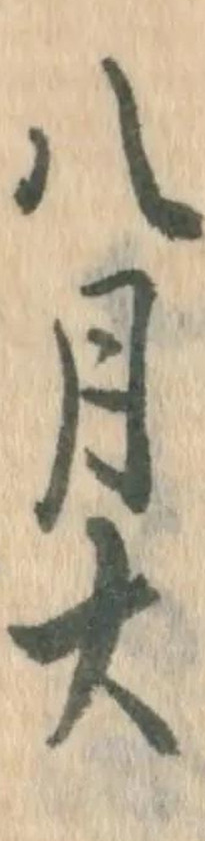八月大
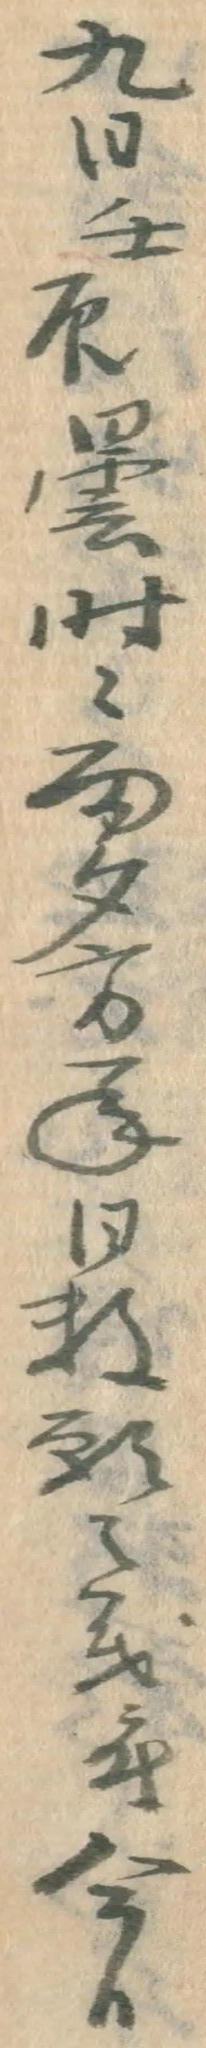九日壬辰曇時々雨、夕方承、日数願之義ニ付、今日

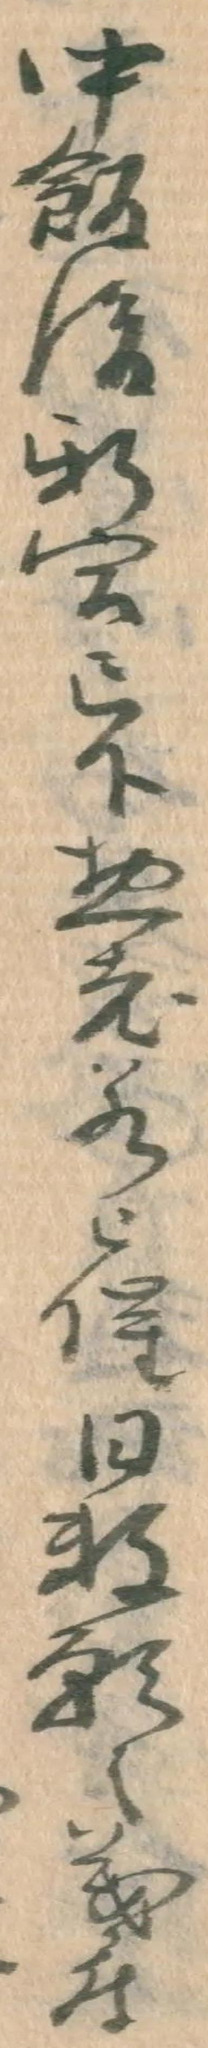中飯後、新宮已下惣老若被催、日数願之義ニ付
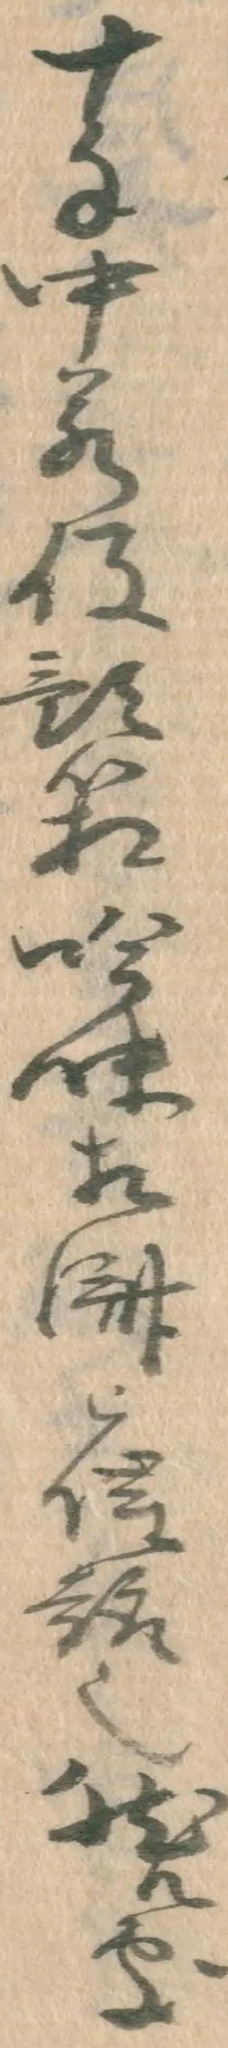十手中若役預箱吟味相済被催趣也、然ル處、
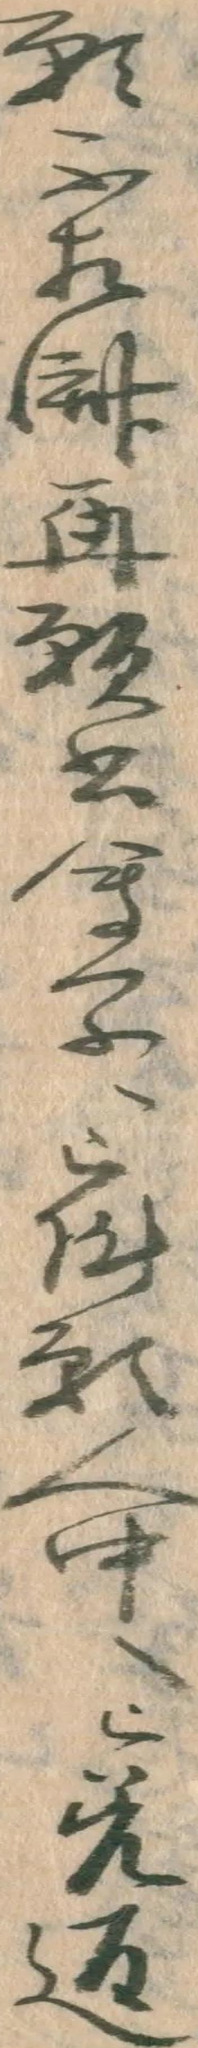願不相済再願書、會所へ被附願人中へ被差返
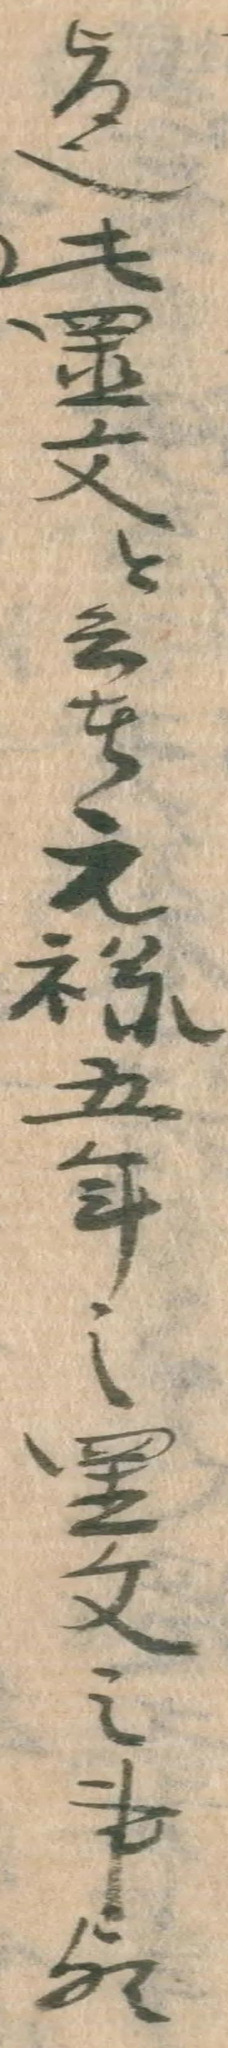旨也、此置文と云者、元禄五年之置文之事歟、
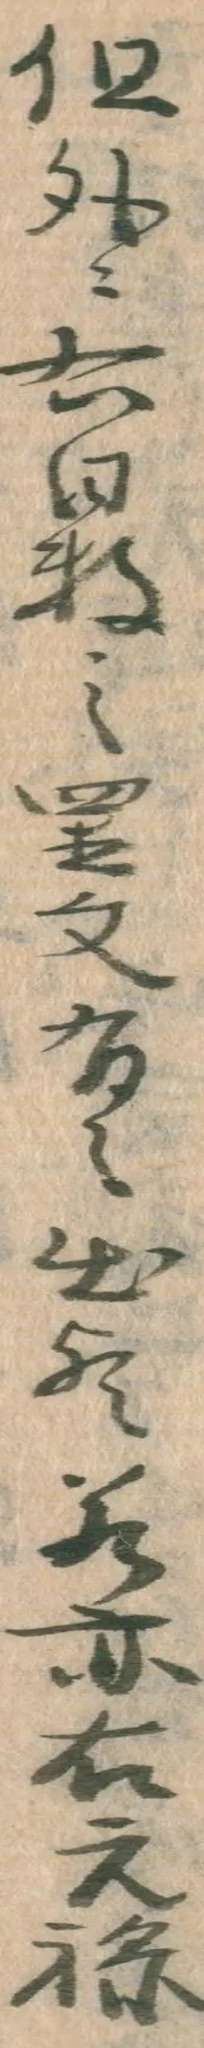但外ニ右日数之置文有之出歟、若亦右元禄
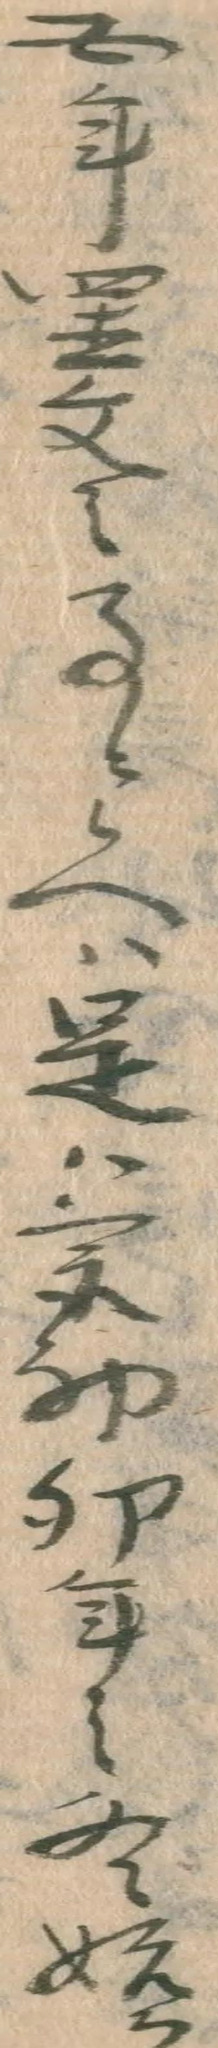五年置文之事ニ候へハ、是ハ最初卯年之冬始而
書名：賀茂社記録. 第63冊
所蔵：国立国会図書館 National Diet Library, JAPAN
